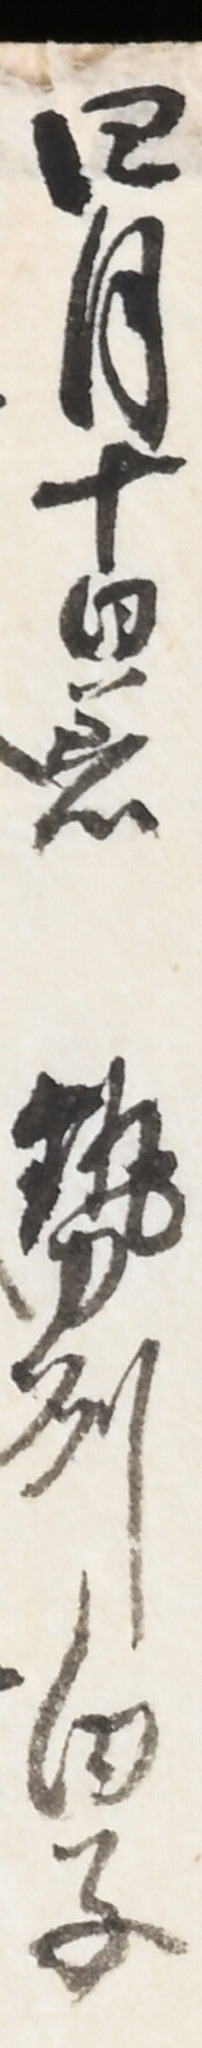四月十日着勢州白子
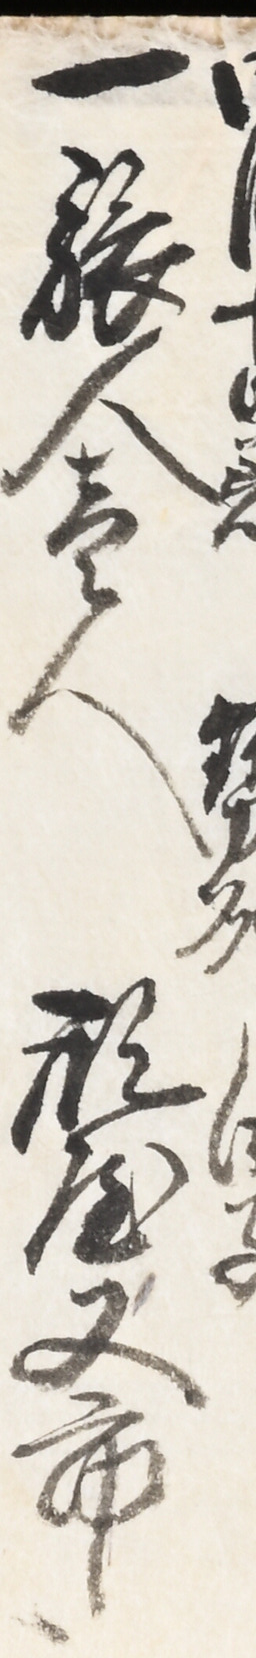一旅人壱人形屋又市
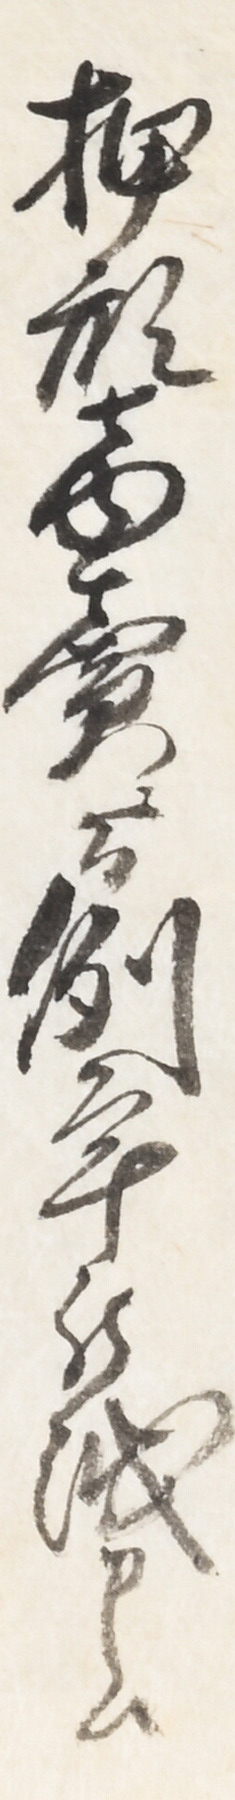押形商売ニ而例年罷越申候
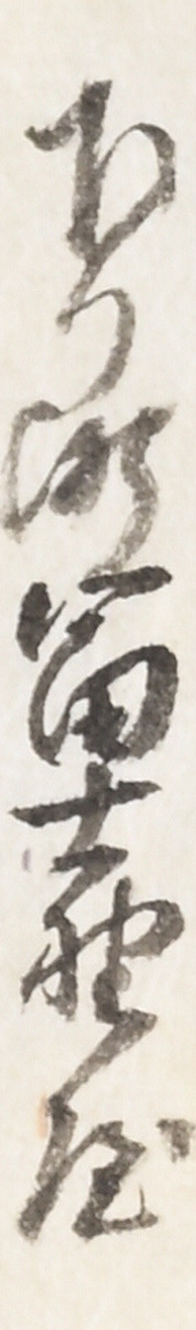下り町富士野屋
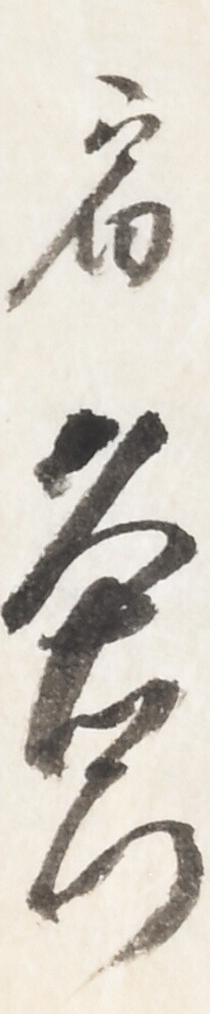宿久右衛門
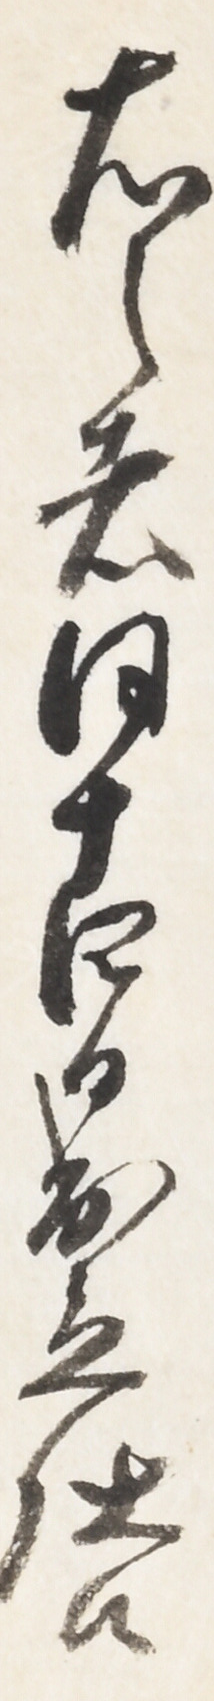右之者同十四日出立仕候
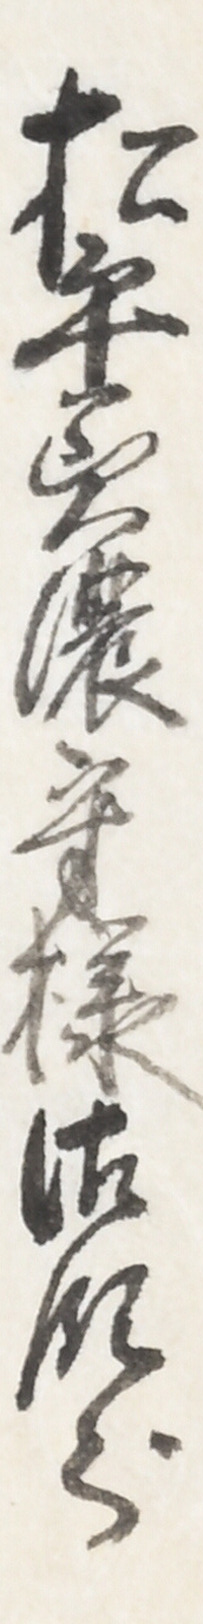松平美濃守様御領分
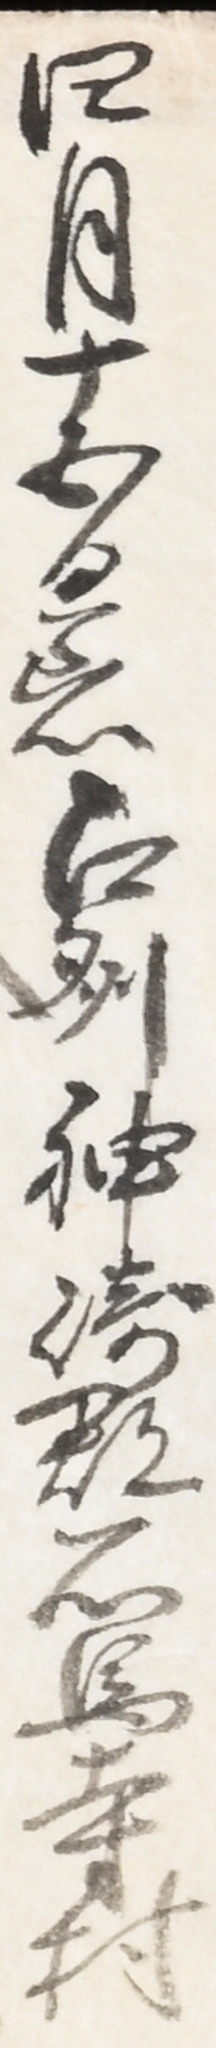四月十五日着江州神崎郡石馬寺村
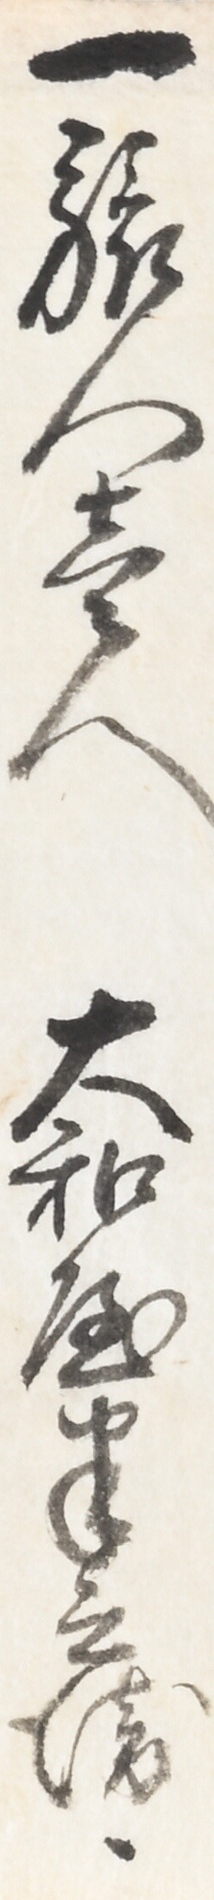一旅人壱人大和屋半兵衛・
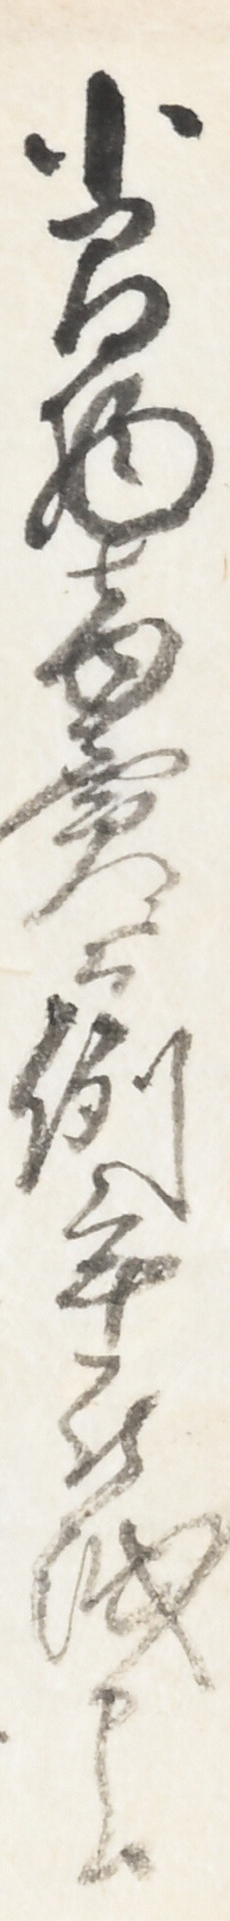小間物商売ニ而例年罷越申候
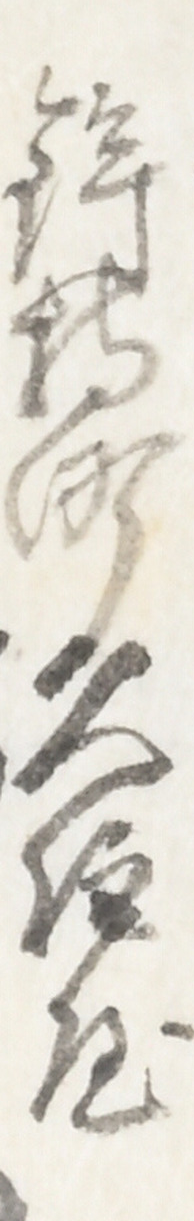鉾持町久住屋
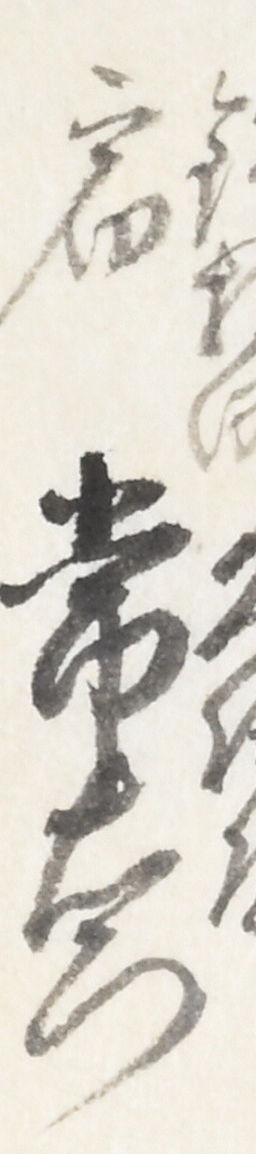宿常右衛門
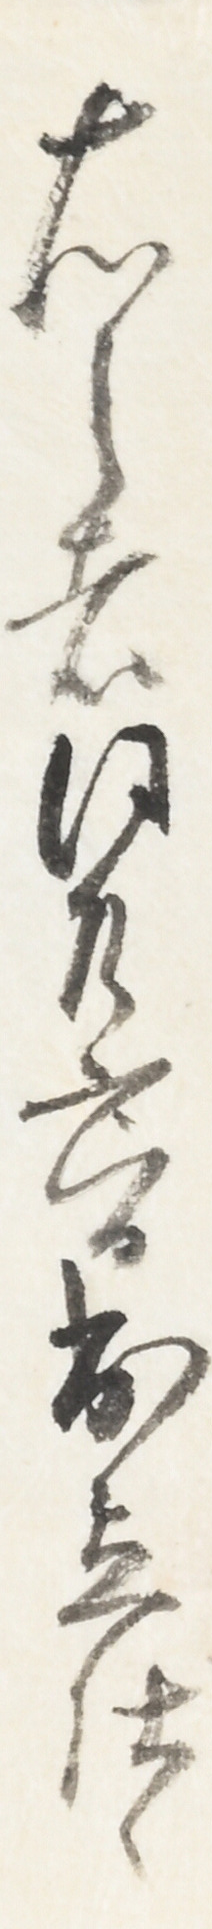右之者同廿六日出立仕候
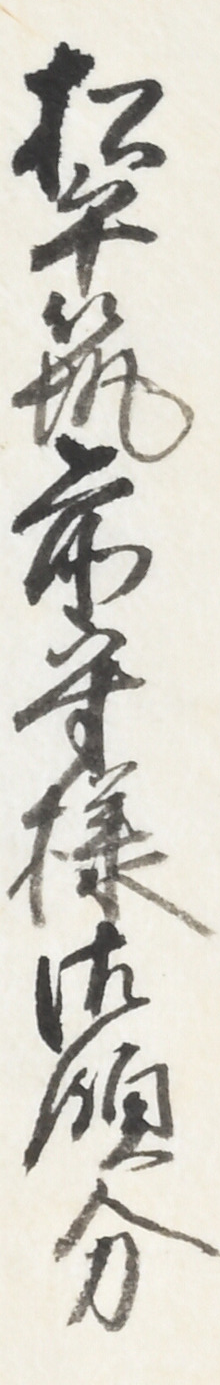松平筑前守様御領分
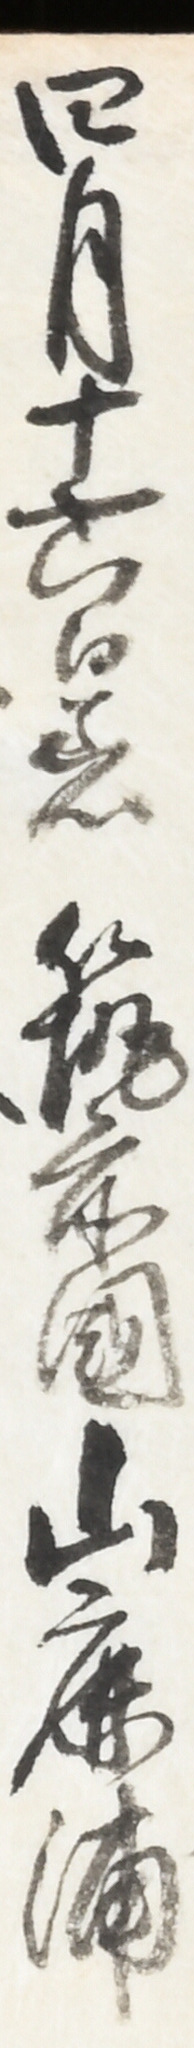四月十六日着筑前国山鹿浦
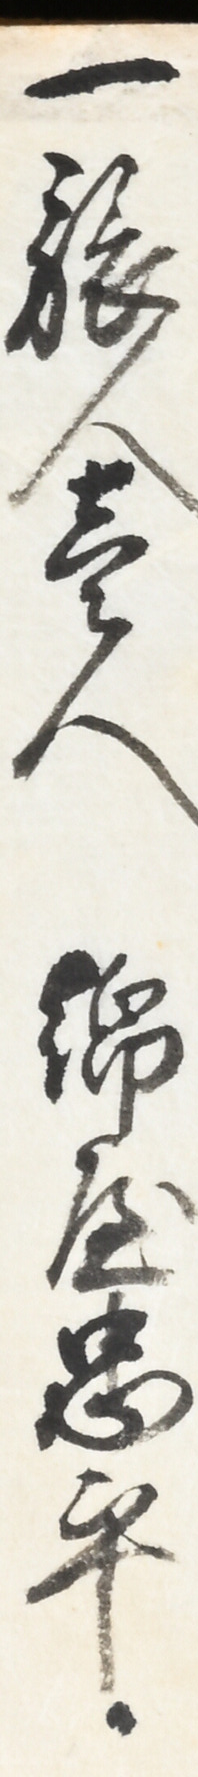一旅人壱人綿屋忠平・
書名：旅人泊控帳
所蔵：伊那市立高遠町図書館・合同会社AMANE
